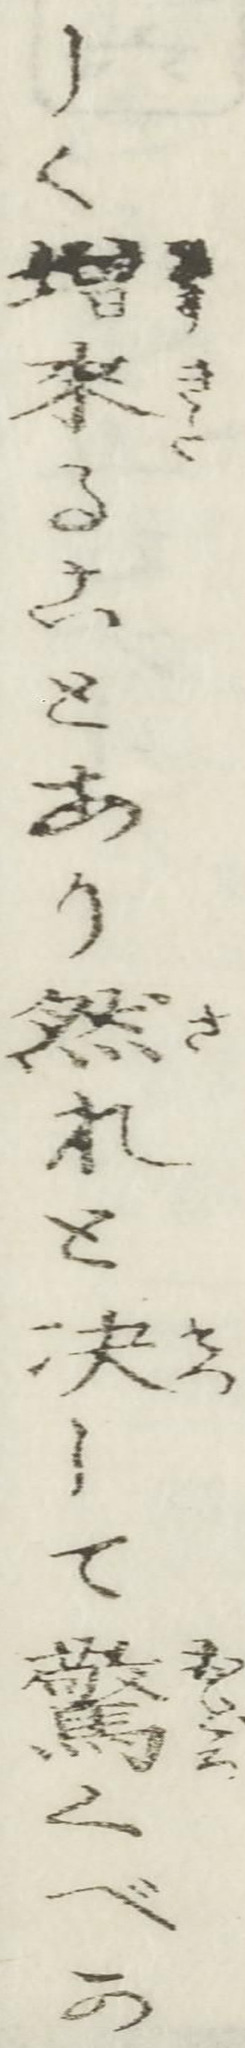しく増来ることあり然れと決して驚くべか
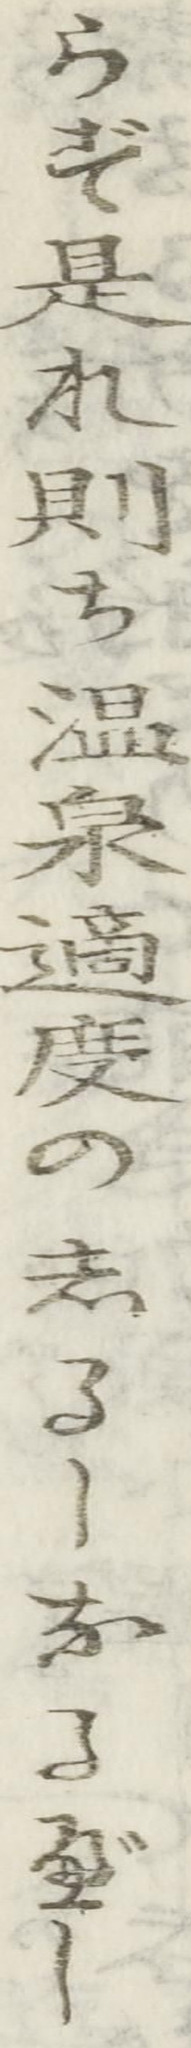らず是れ則ち温泉適度のしるしなるべし
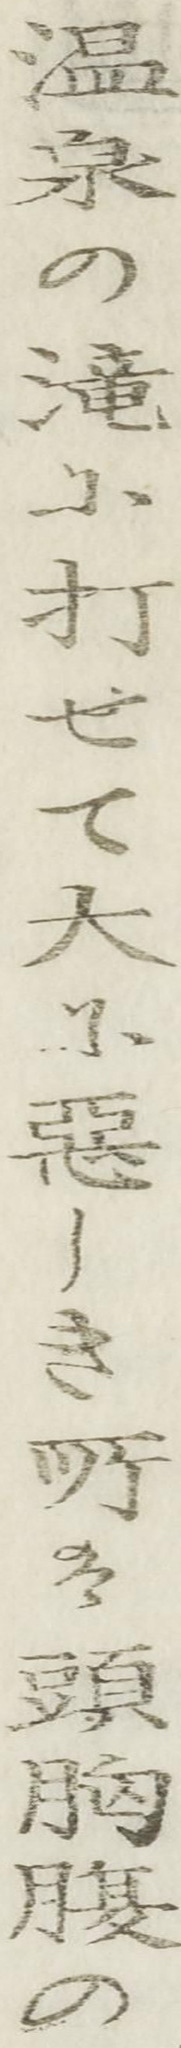温泉の滝に打せて大に悪しき所は頭胸腹の
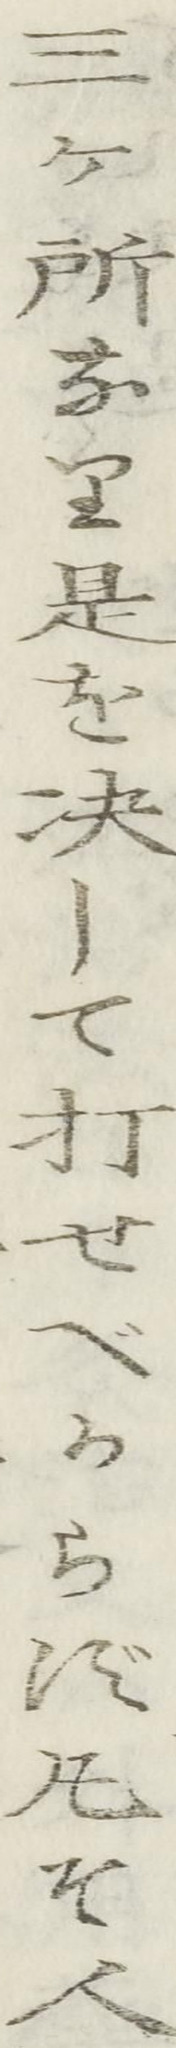三ヶ所なり是を決して打せべからず凡そ人
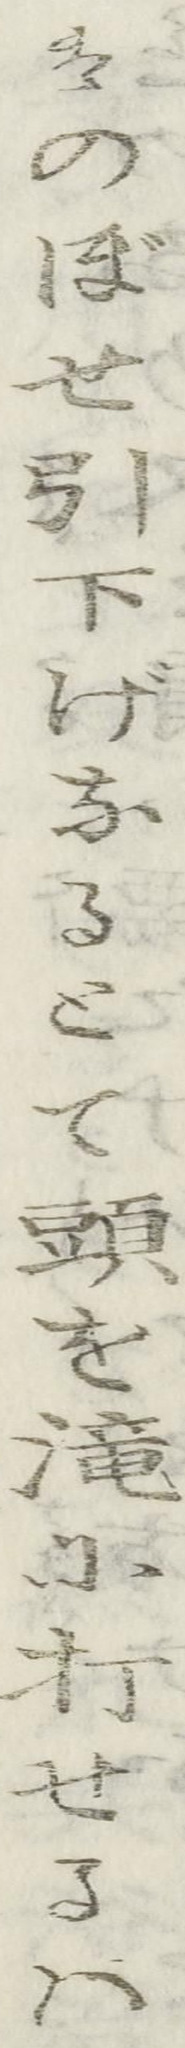はのぼせ引下げなるとて頭を滝に打せるは
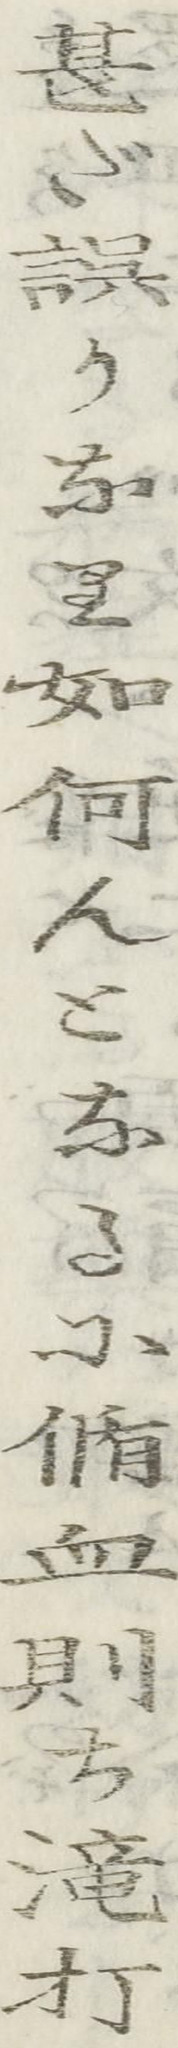甚だ誤りなり如何んとなるに循血則ち滝打
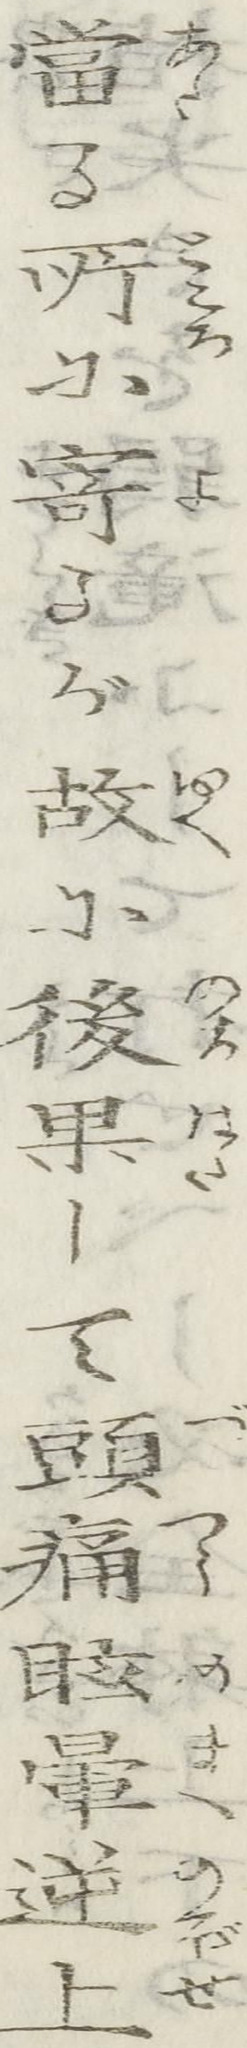当る所に寄るが故に後果して頭痛眩暈逆上
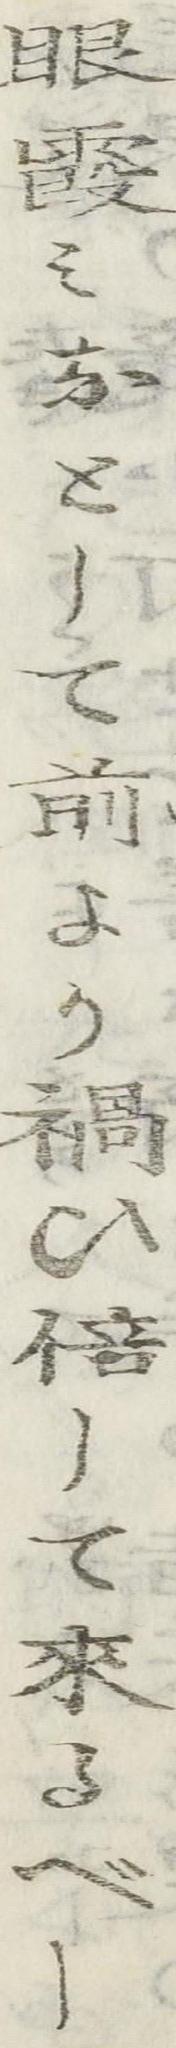眼霞みなとして前より禍ひ倍して来るべし
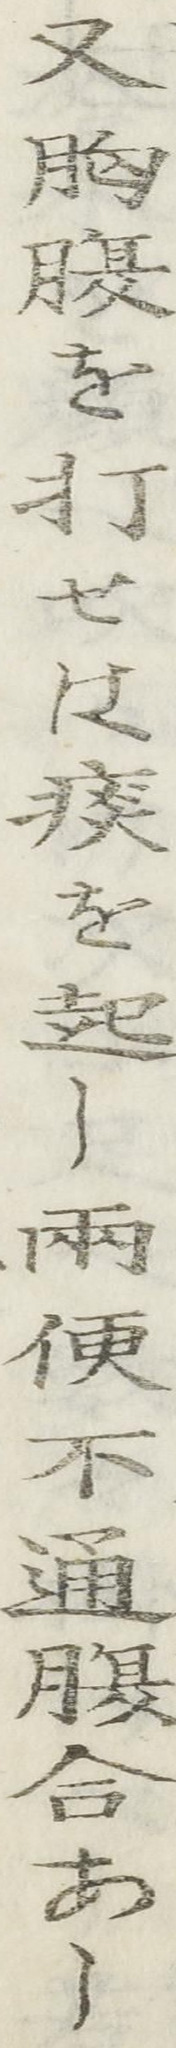又胸腹を打せは痰を起し両便不通腹合あし
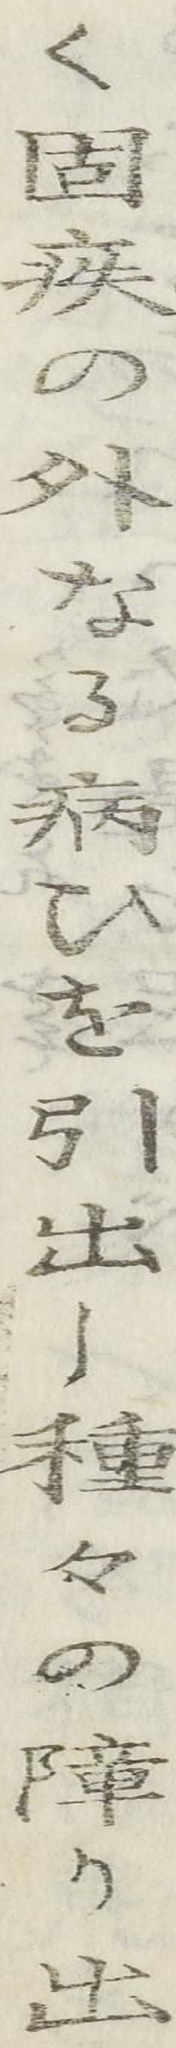く固疾の外なる病ひを引出し種々の障り出

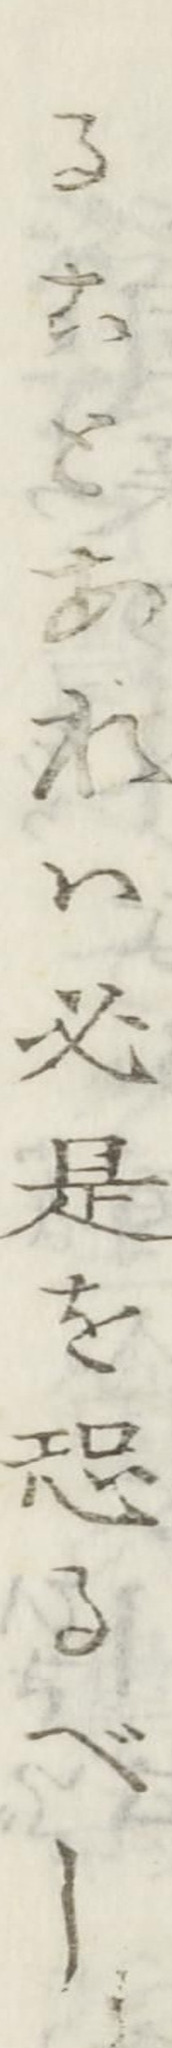ることあれは必是を恐るべし
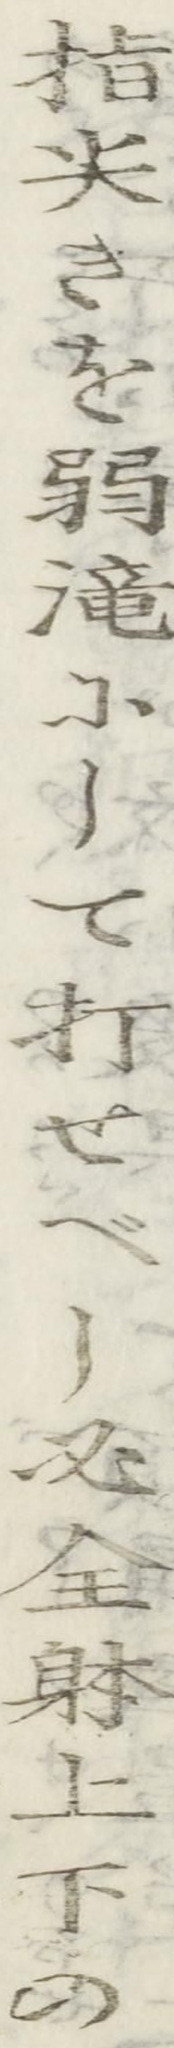指尖きを弱滝にして打せべし必全体上下の
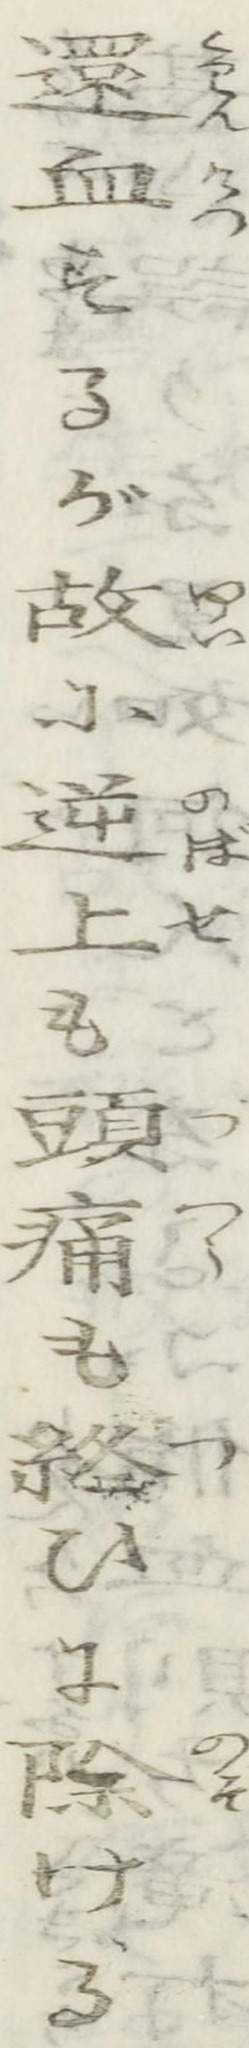還血するが故に逆上も頭痛も終ひに除ける
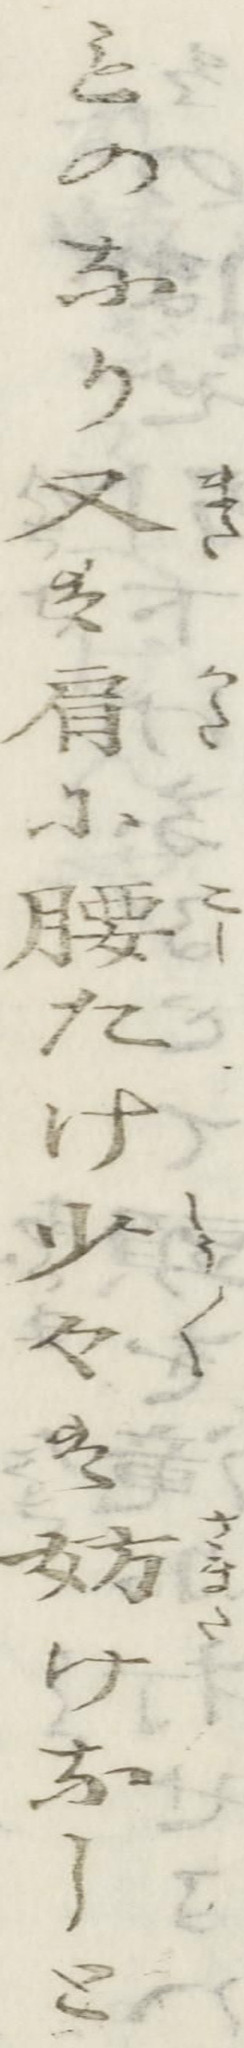とのなり又は肩に腰たけ少々は妨げなしと
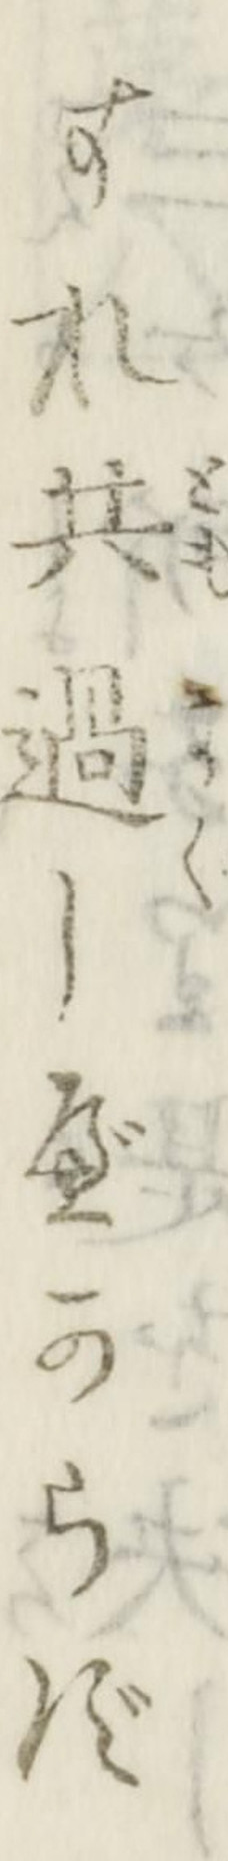すれ共過しべからず
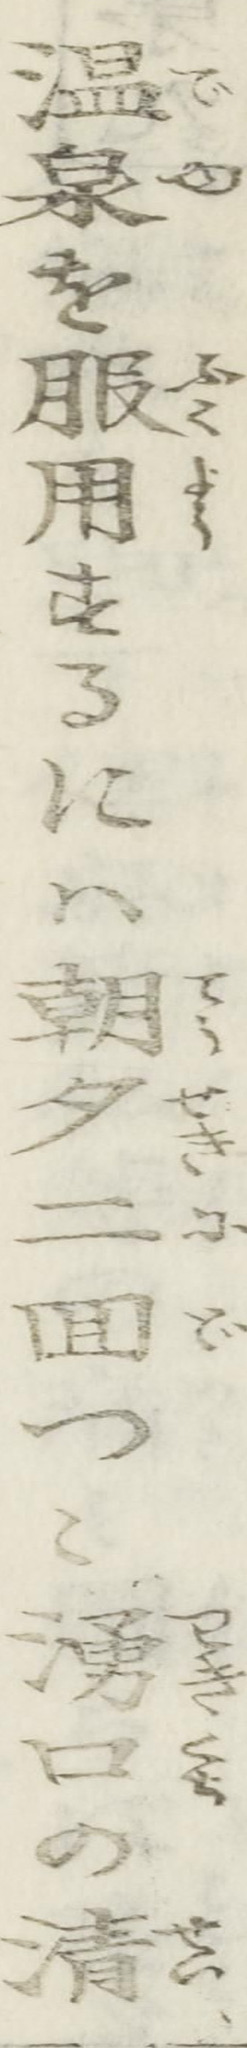温泉を服用するには朝夕二回つゝ湧口の清
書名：鎌先温泉由來記
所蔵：東京大学地震研究所図書室 Earthquake Research Institute Library, The University of Tokyo, JAPAN
